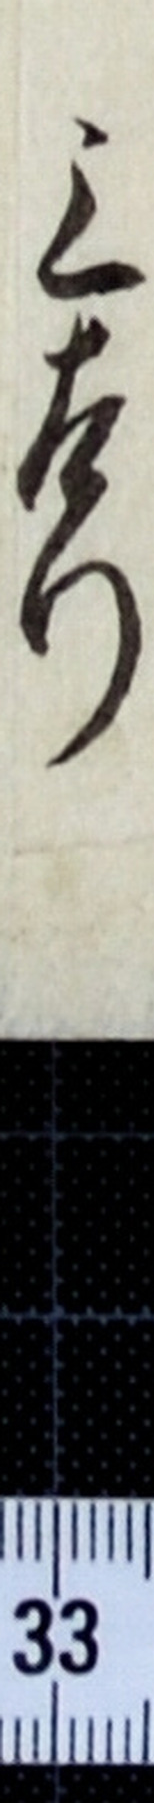茂左衛門
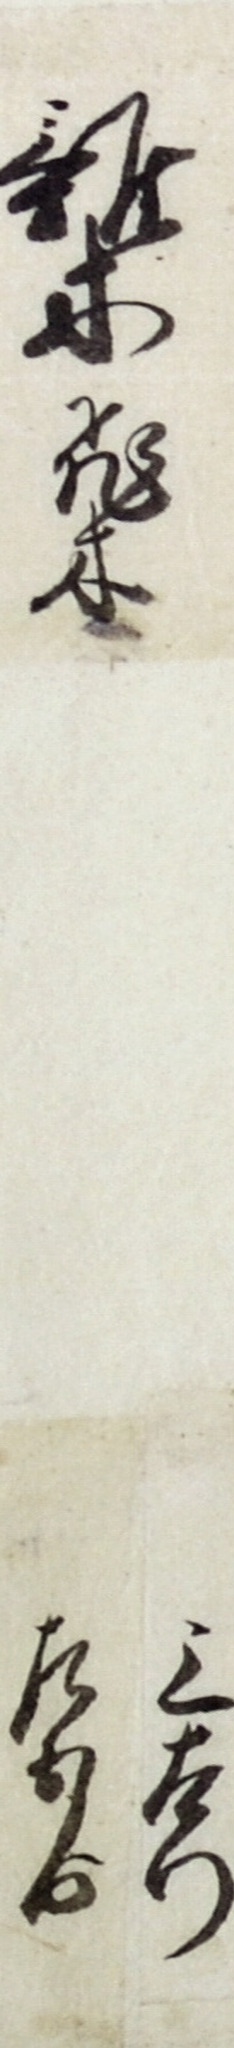雑木飛木三右衛門
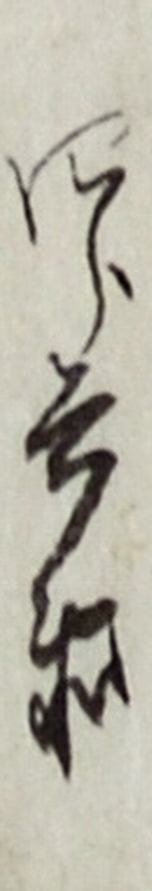四郎兵衛

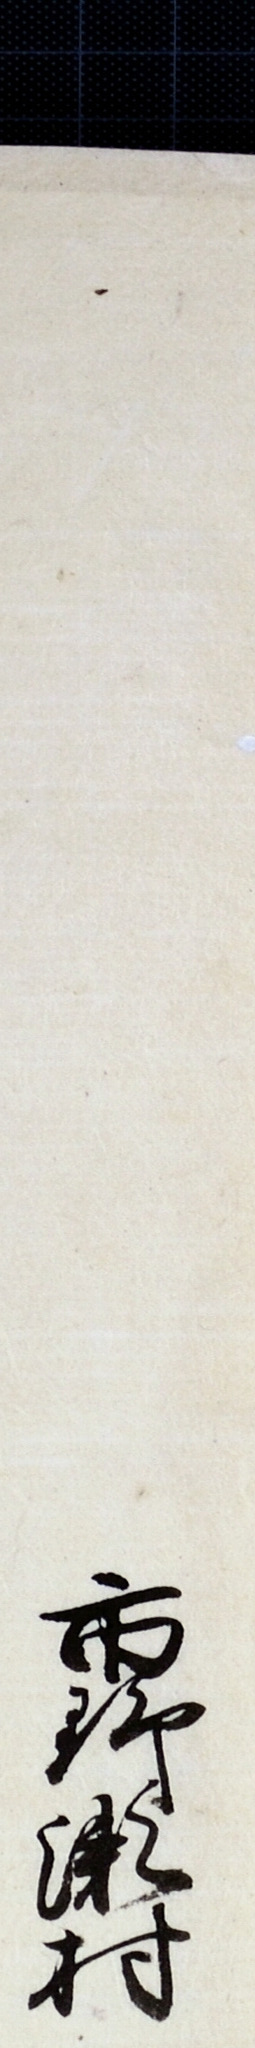市野瀬村
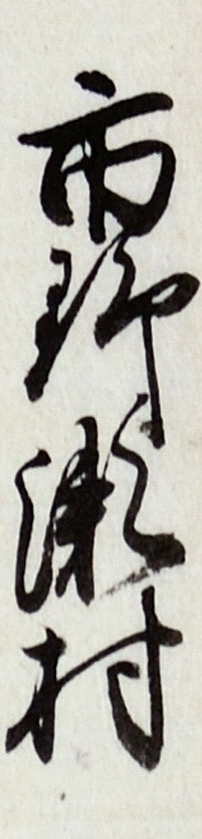市野瀬村
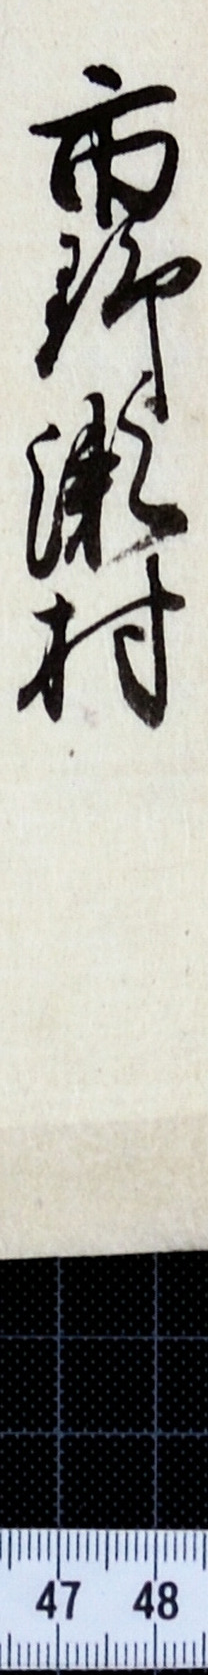市野瀬村
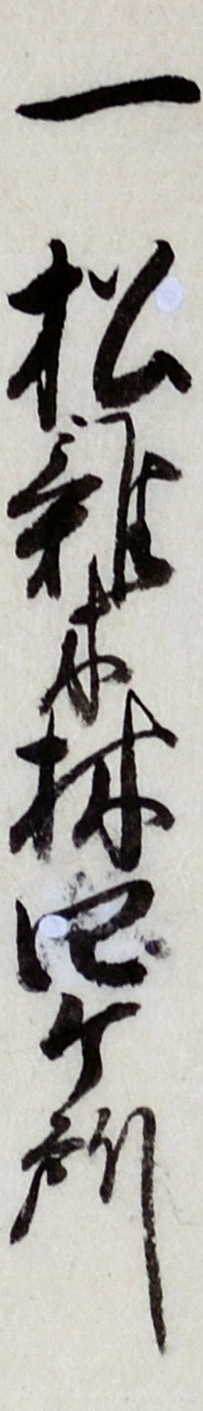一松雑木林四ケ所
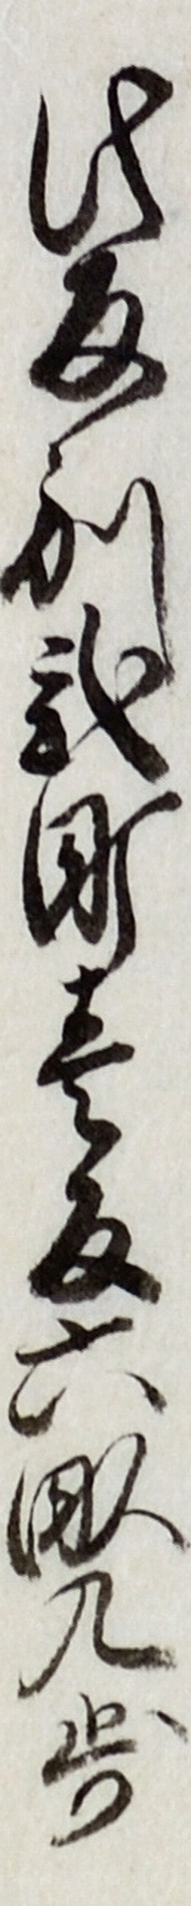此反別弐町壱反六畝九歩
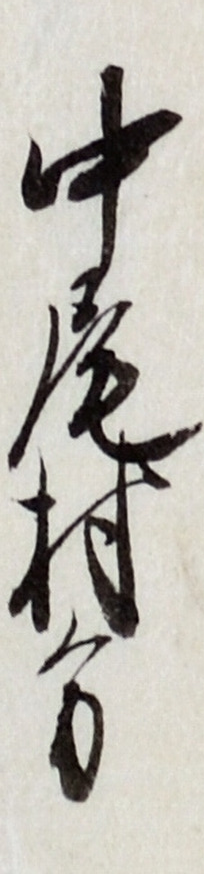中尾村分
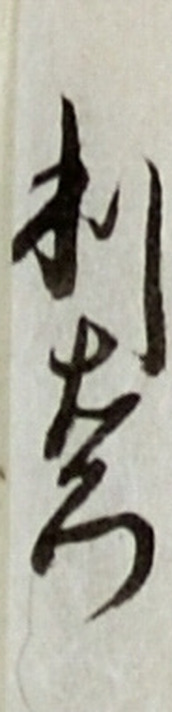三右衛門

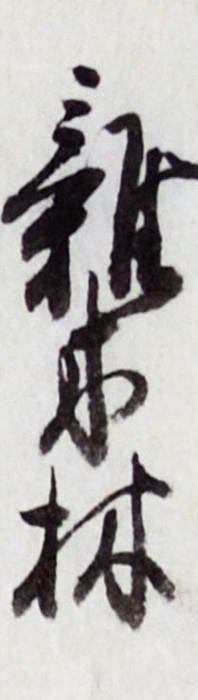雑木林
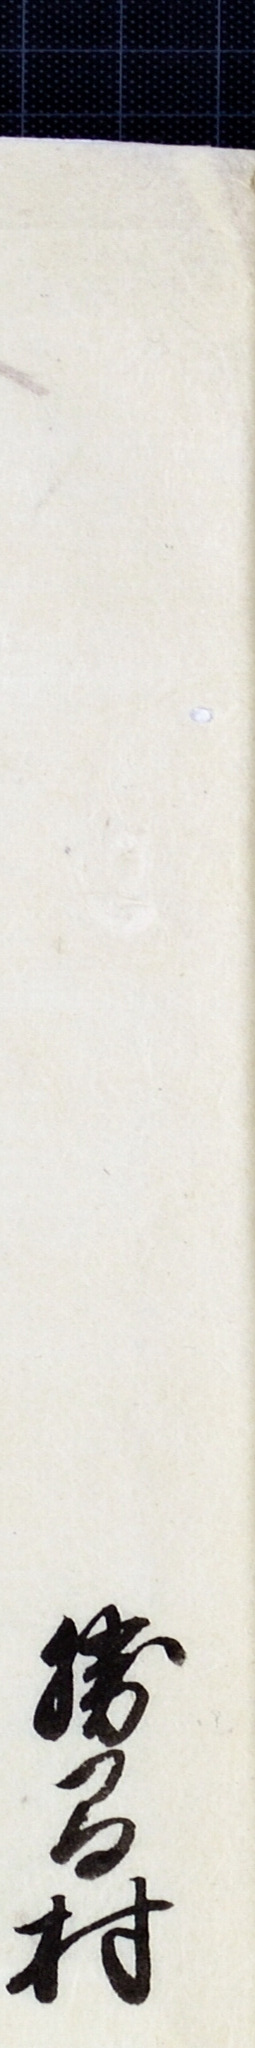勝間村
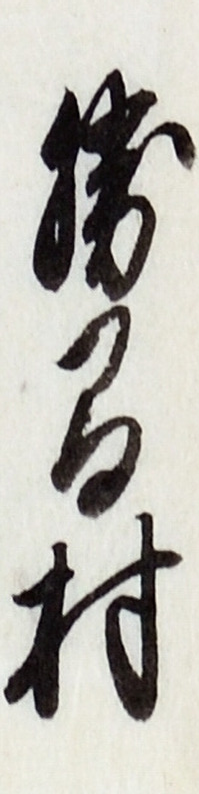勝間村
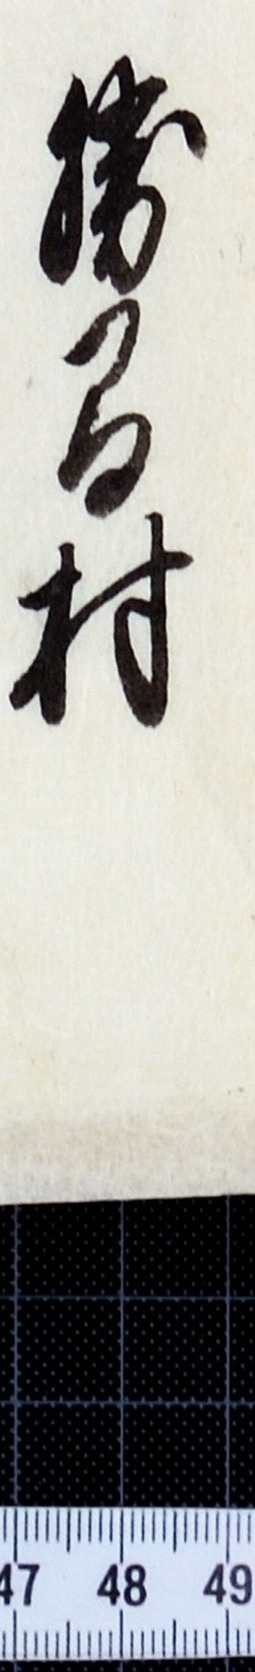勝間村
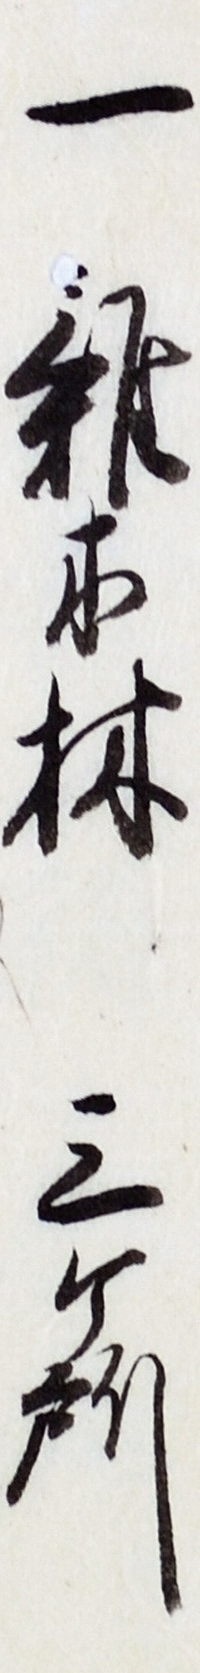一雑木林三ケ所
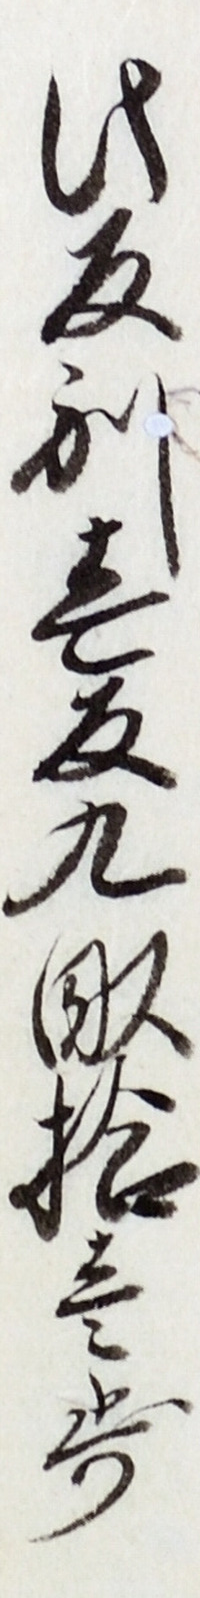此反別壱反九畝拾壱歩
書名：御領分中御林御藪附帳
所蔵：伊那市立高遠町図書館・合同会社AMANE
